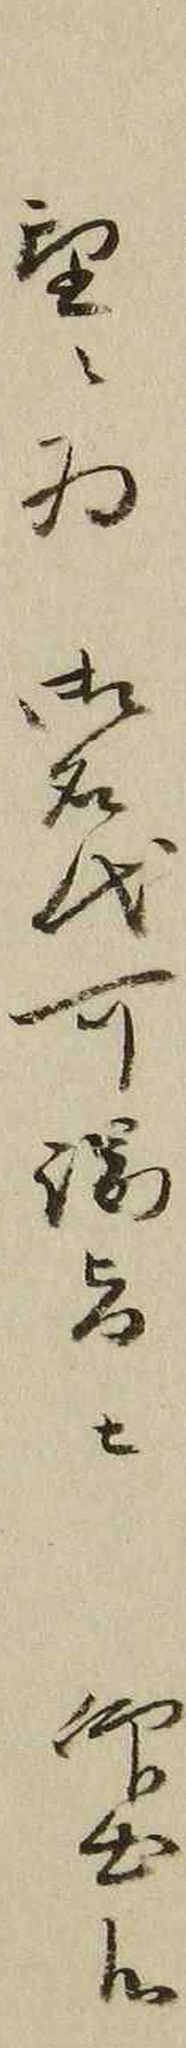望之為御名代可謁旨被仰出候
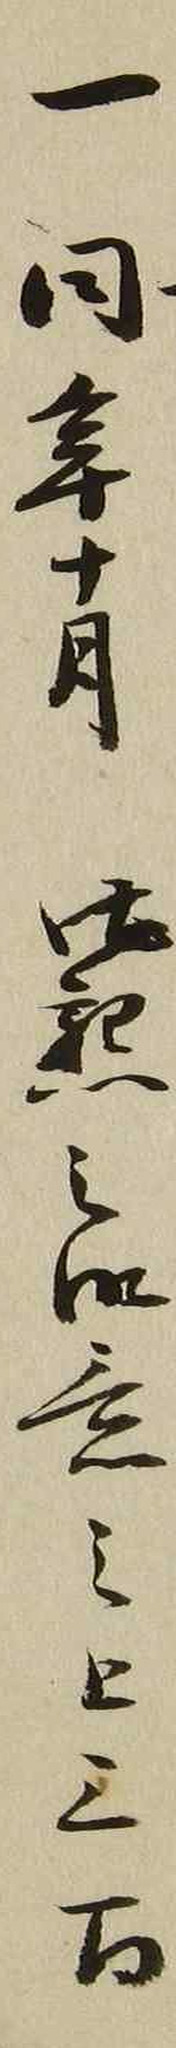一同年十月御懇之御意之上三百
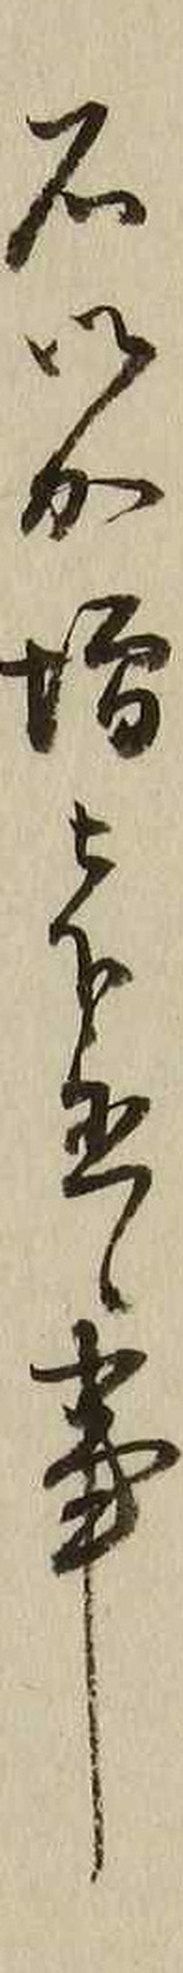石御加増被下置候事
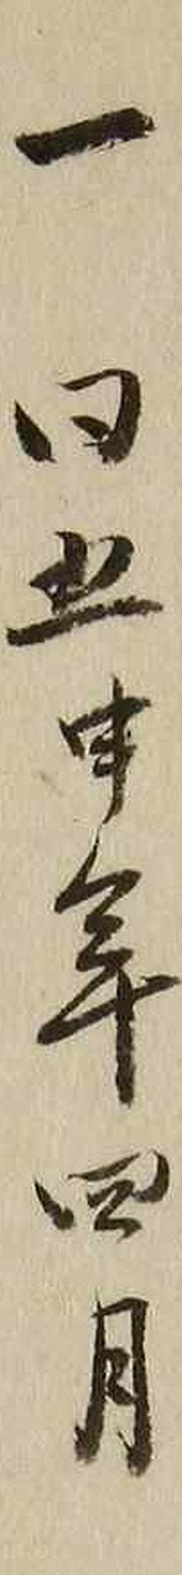一同五申年四月
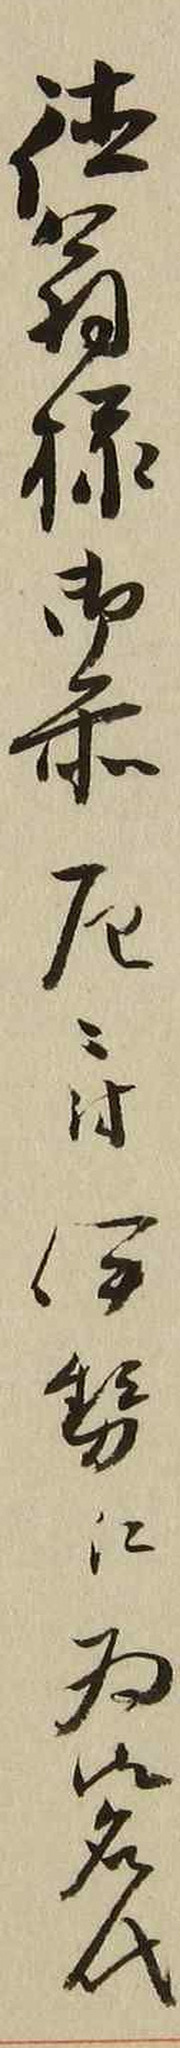徳翁様御前厄に付伊勢江為御名代
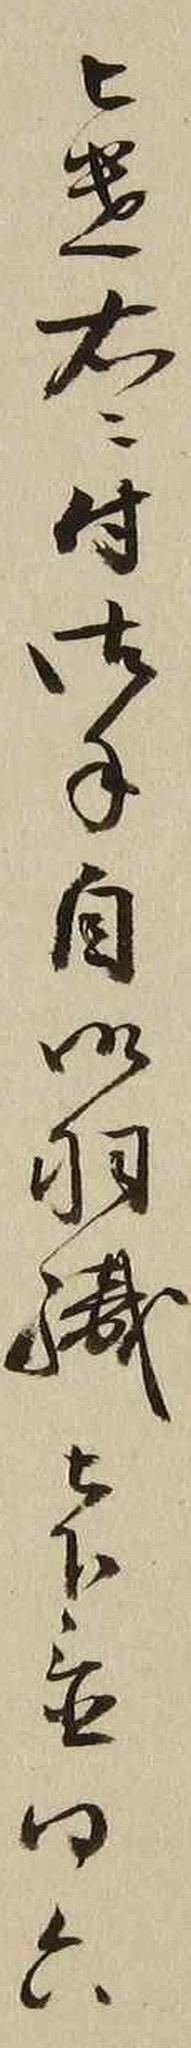被遣右に付御手自御羽織被下置同六
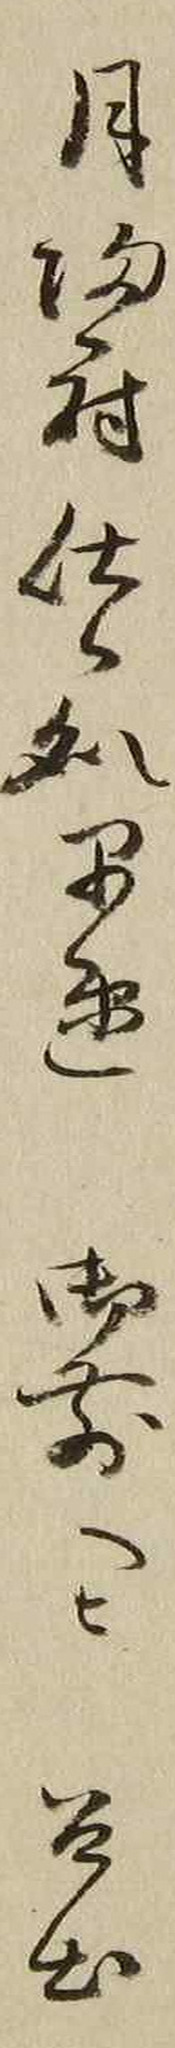月帰府仕候処早速御前へ被召出
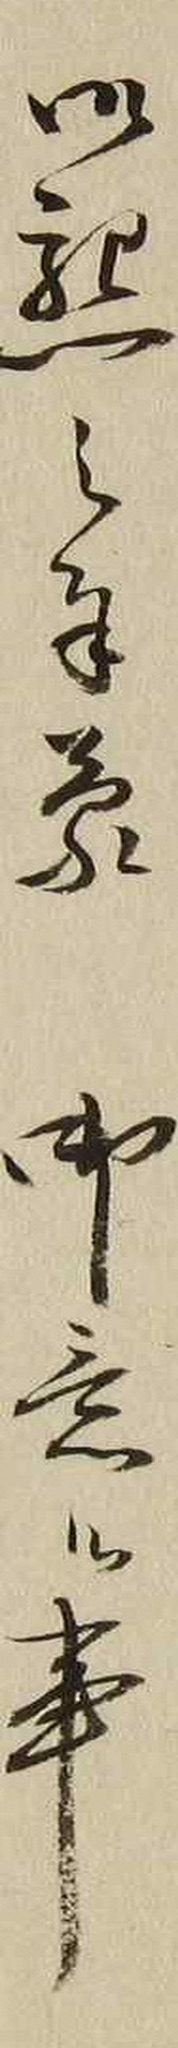御懇之奉蒙御意候事
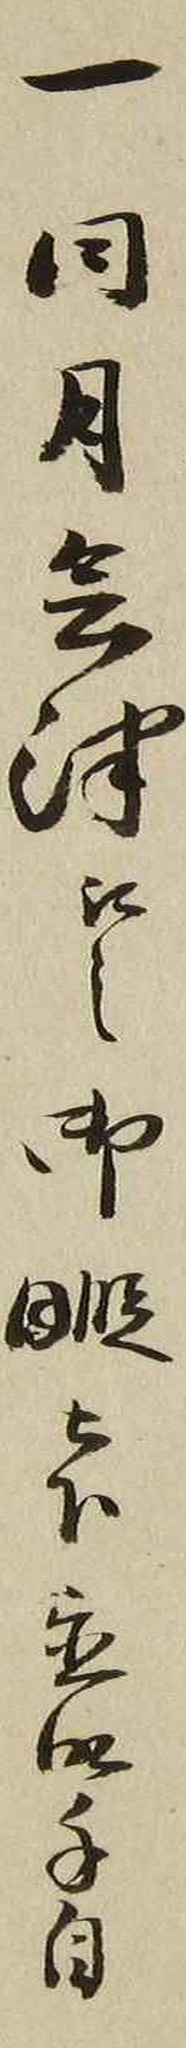一同月会津江之御暇被下置御手自
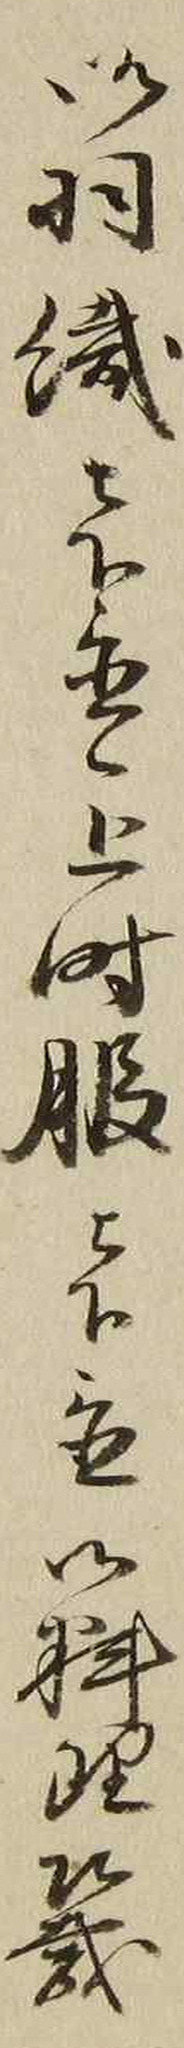御羽織被下置候上時服被下置御料理頂戴
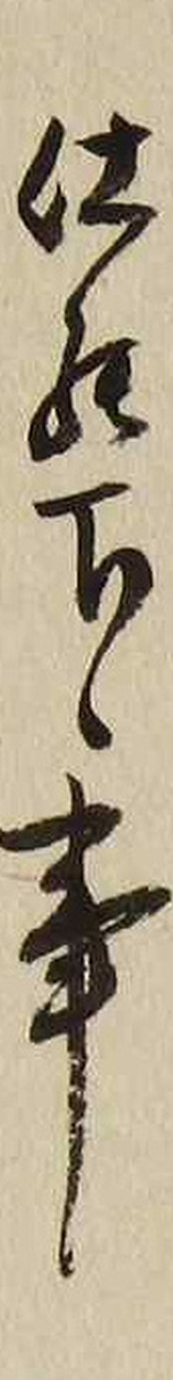仕罷下候事
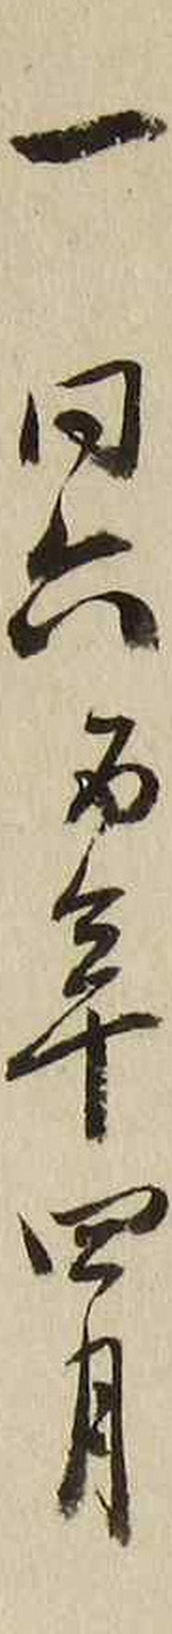一同六丑年四月
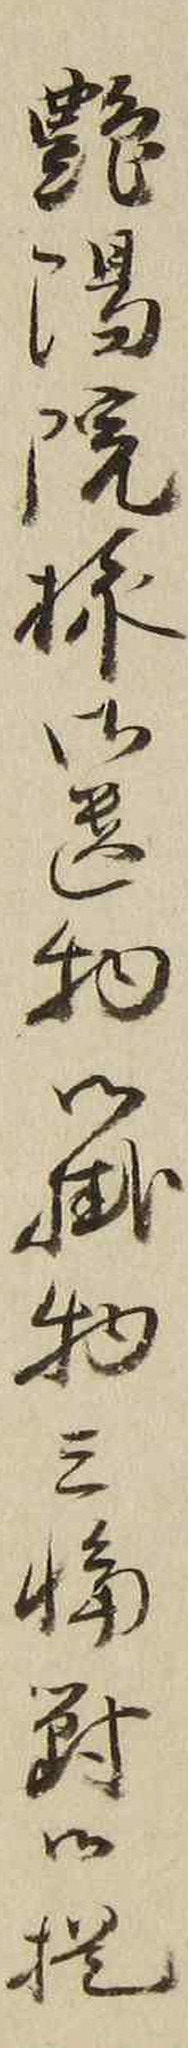艶陽院様御遺物御掛物江幅対御提
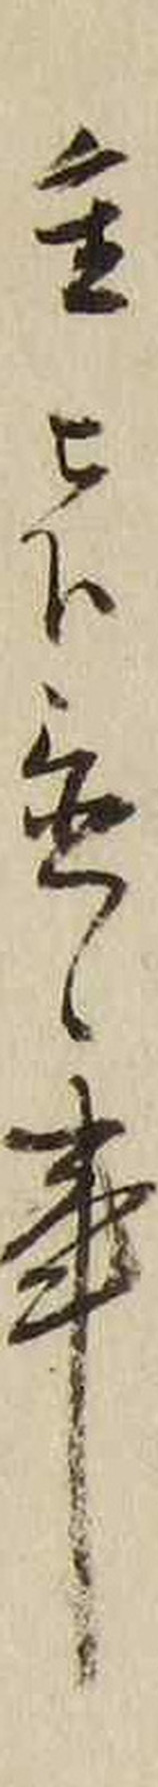重被下置候事
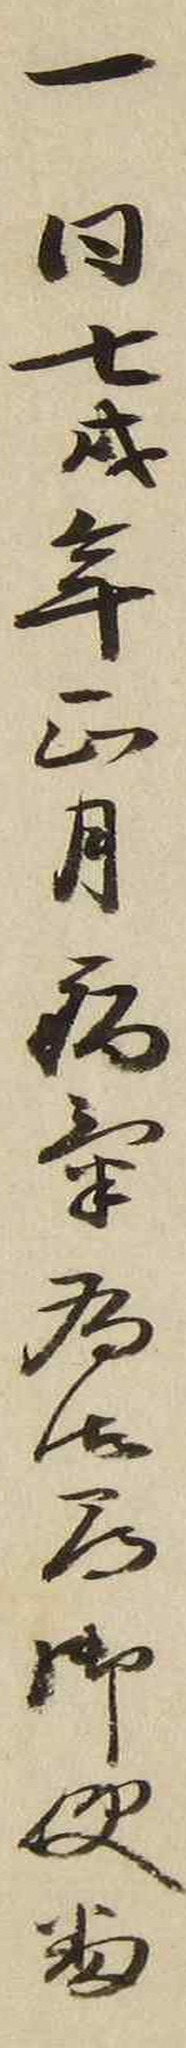一同七戌年正月病気為御尋御使番

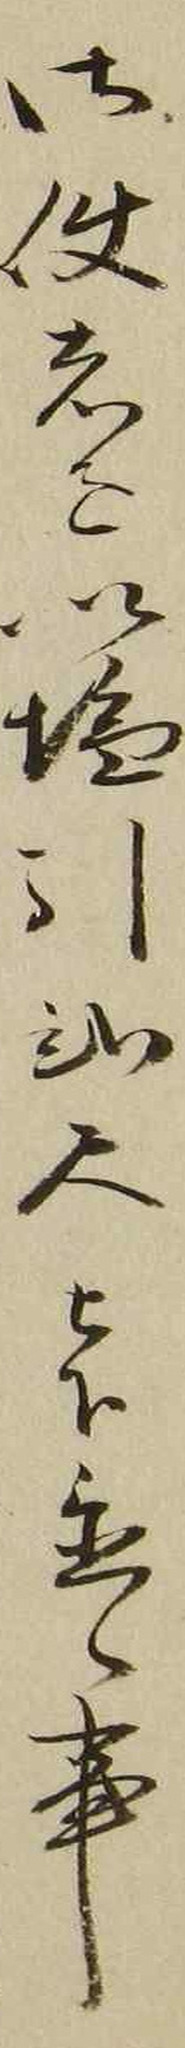御使者を以塩引弐尺被下置候事
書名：諸士系譜　巻之269　さ之部1
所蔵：会津若松市立会津図書館
